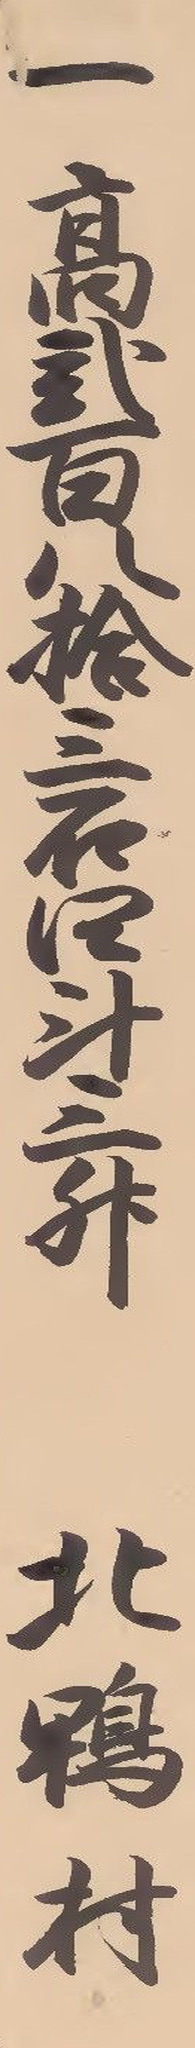一高弐百八拾三石四斗三升北鴨村
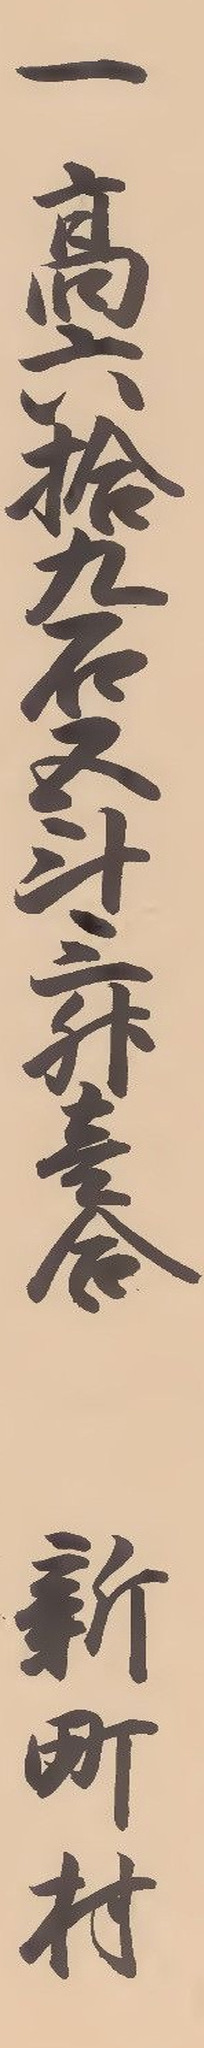一高六拾九石五斗三升壱合新町村
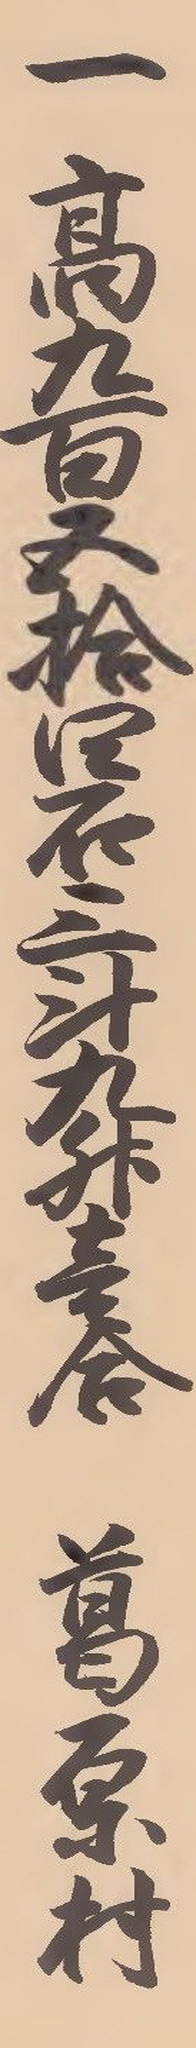一高九百五拾四石三斗九升壱合葛原村
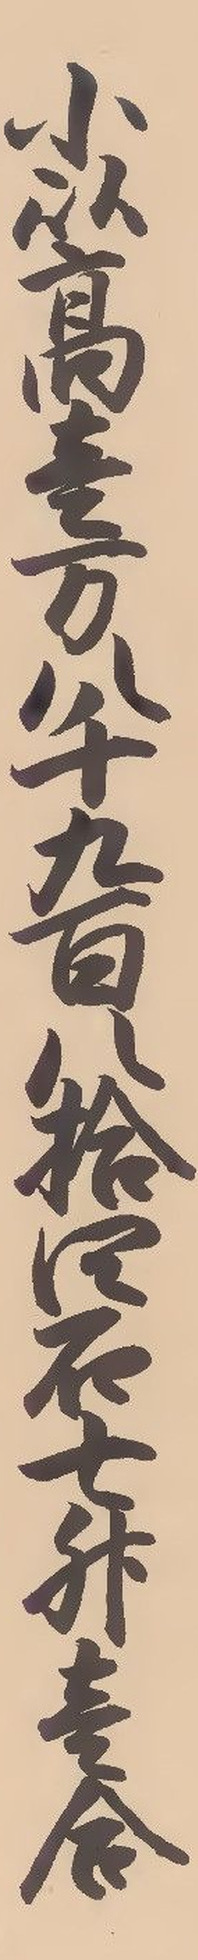小以高壱万八千九百八拾四石七升壱合

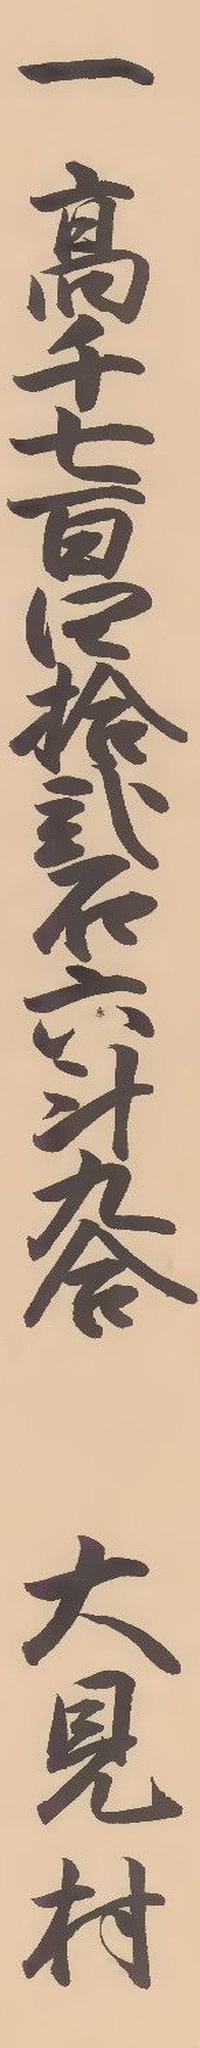一高千七百四拾弐石六斗九合大見村
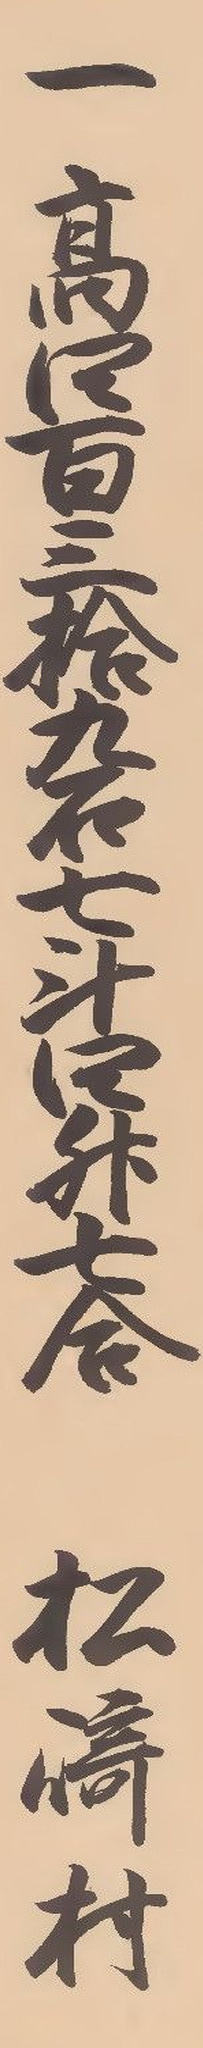一高四百三拾九石七斗四升七合松崎村

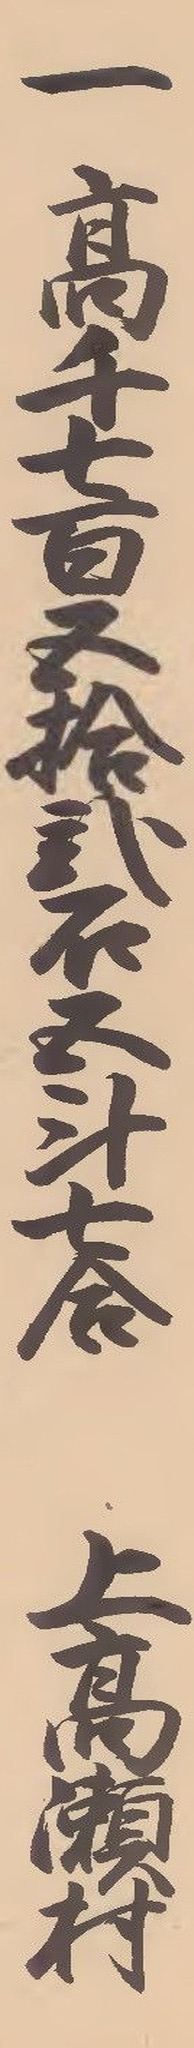一高千七百五拾弐石五斗七合上高瀬村
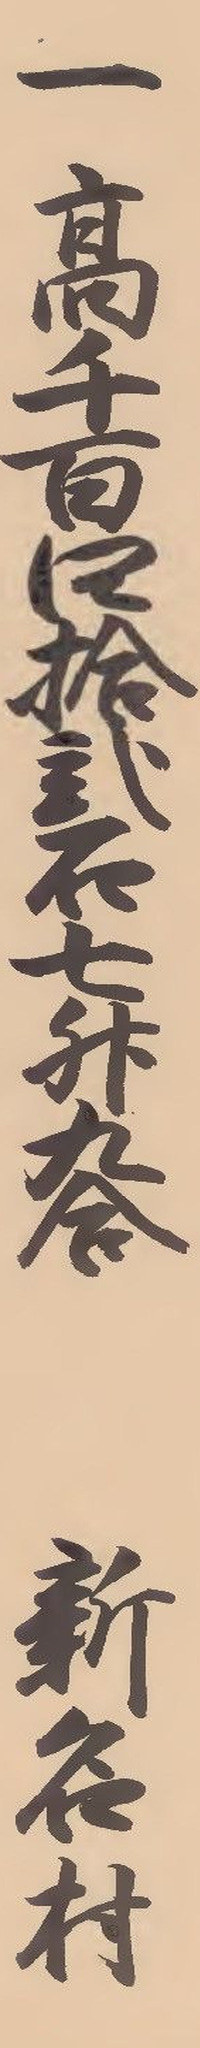一高千百四拾弐石七升九合新名村
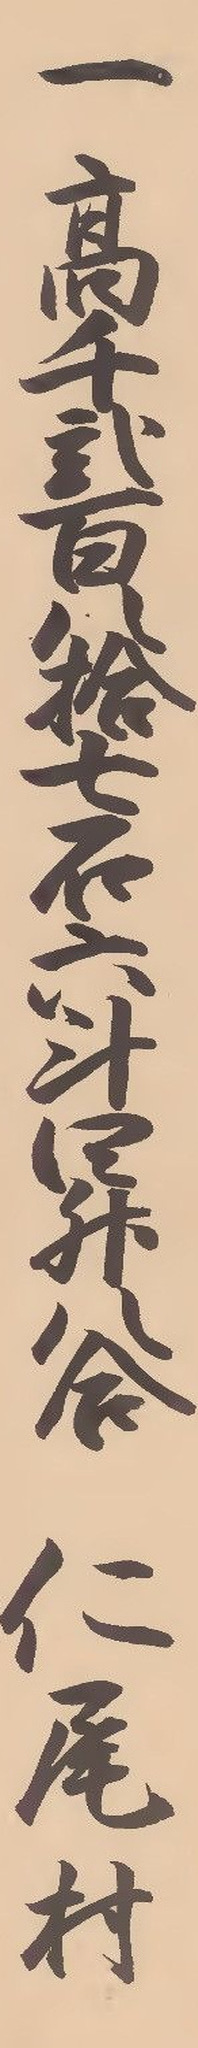一高千弐百八拾七石六斗四升八合仁尾村
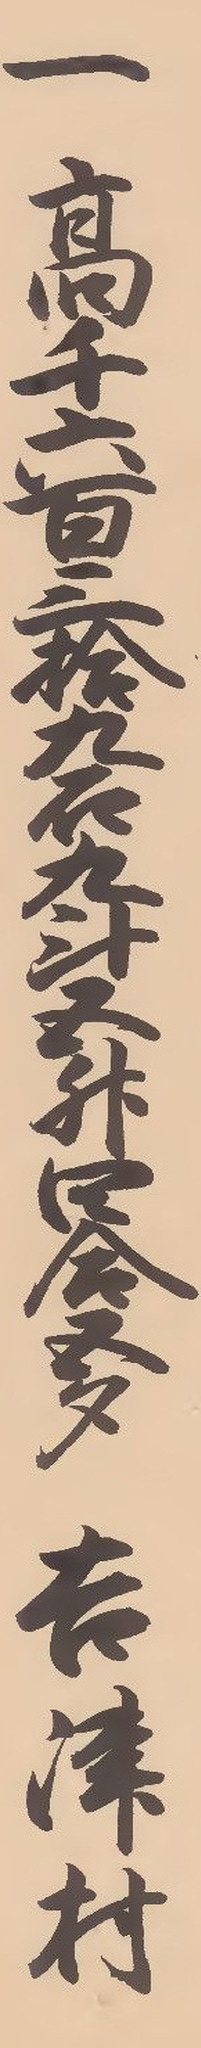一高千六百三拾九石九斗五升四合五勺吉津村
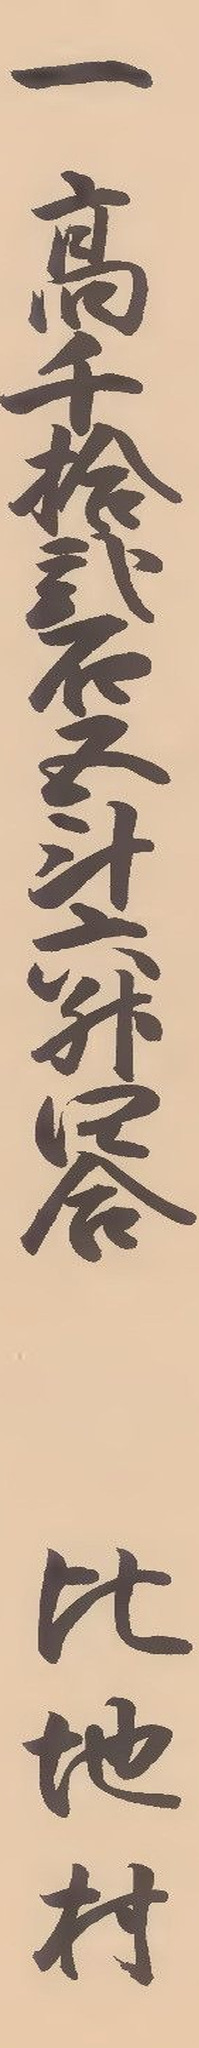一高千拾弐石五斗六升四合比地村
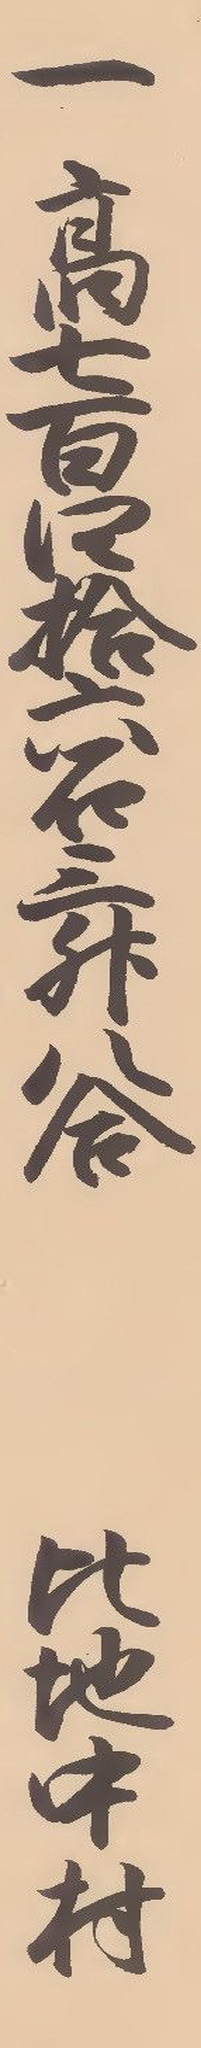一高七百四拾六石三升八合比地中村
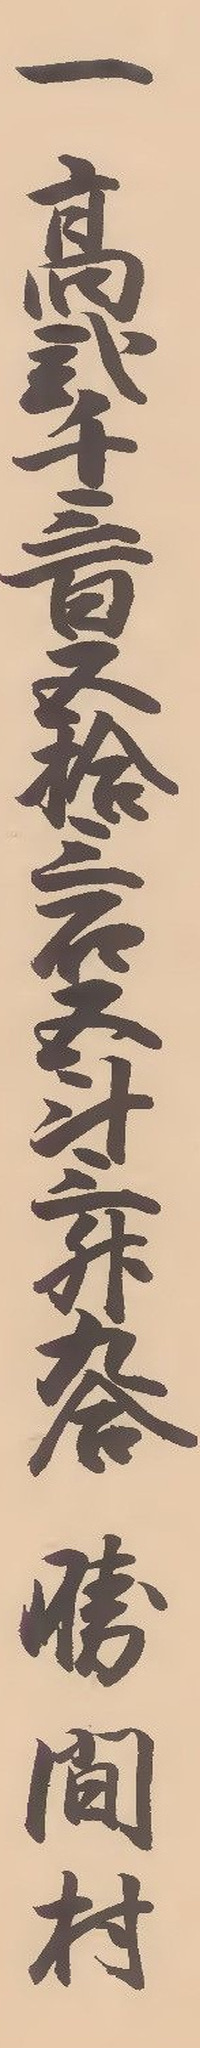一高弐千三百五拾三石五斗三升九合勝間村

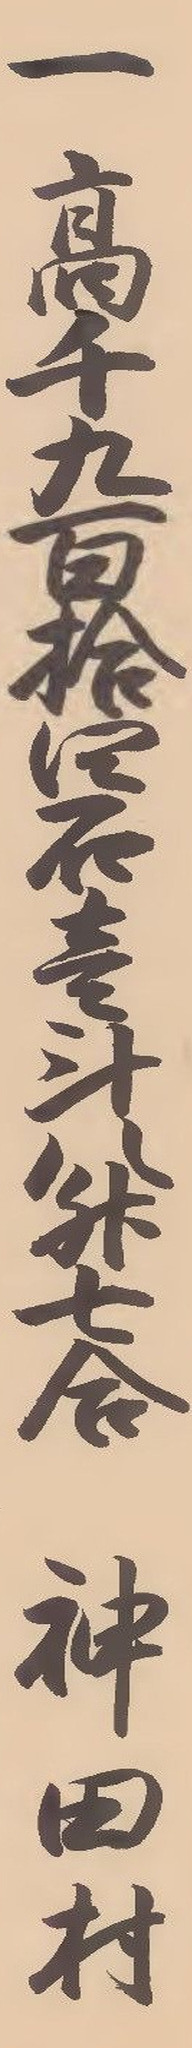一高千九百拾四石壱斗八升七合神田村
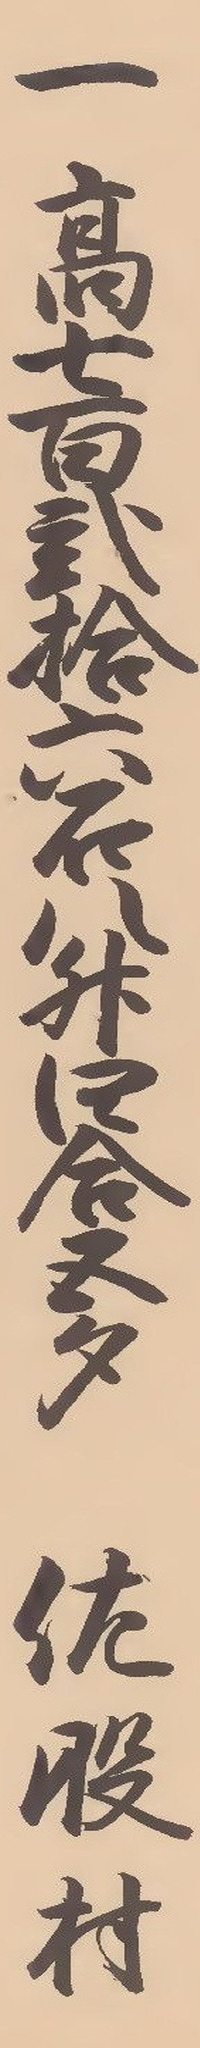一高七百弐拾六石八升四合五勺佐股村
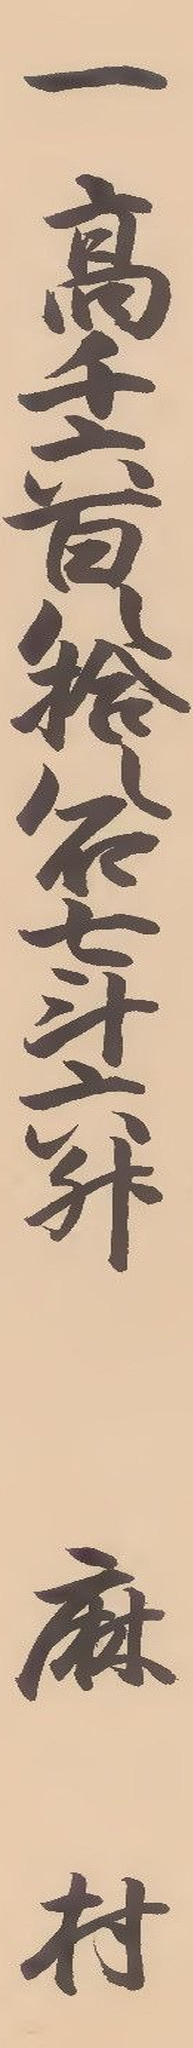一高千六百八拾八石七斗六升麻村
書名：讃岐国郷帳
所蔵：国立公文書館 National Archives of Japan
